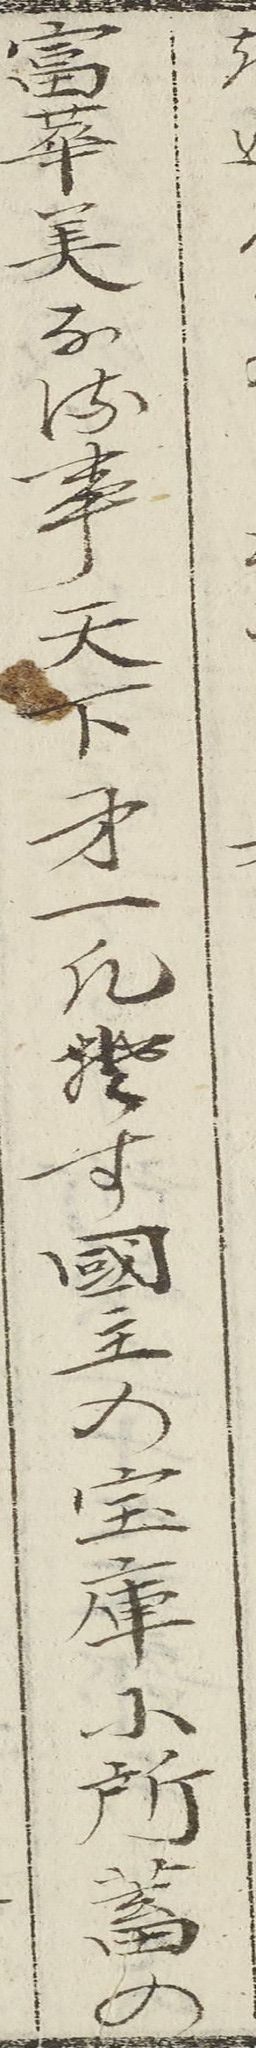富華美なる事天下第一凡そす国主の宝庫に所蓄の
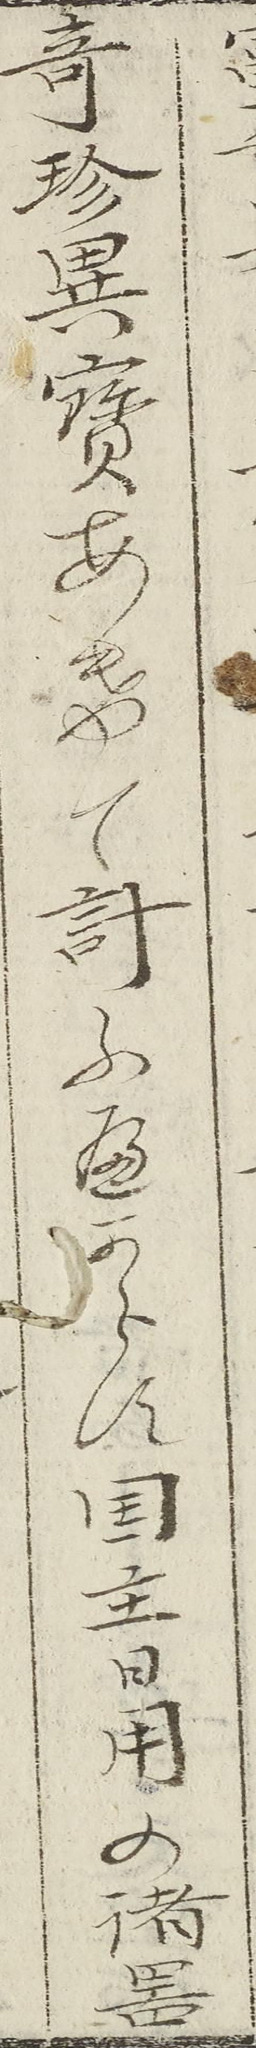奇珍異宝あけて計ふへからす国主日用の諸器
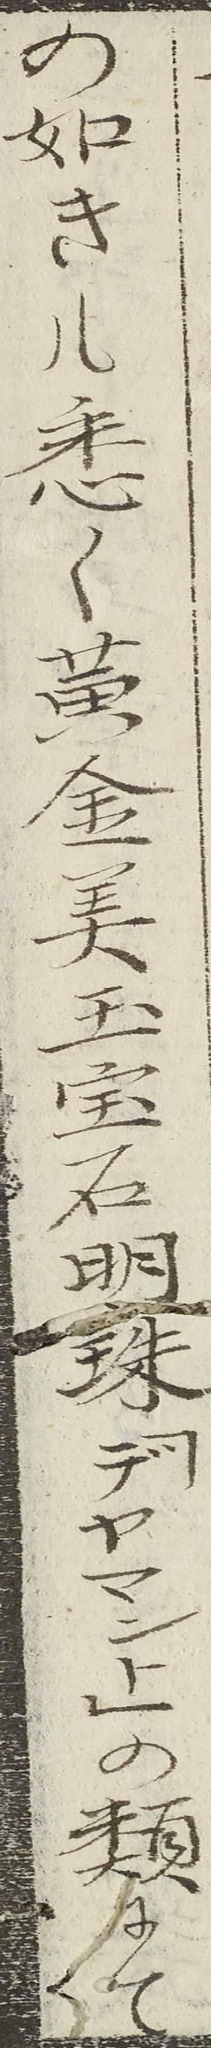の如きハ悉く黄金美玉宝石明珠「デヤモント」の類にて
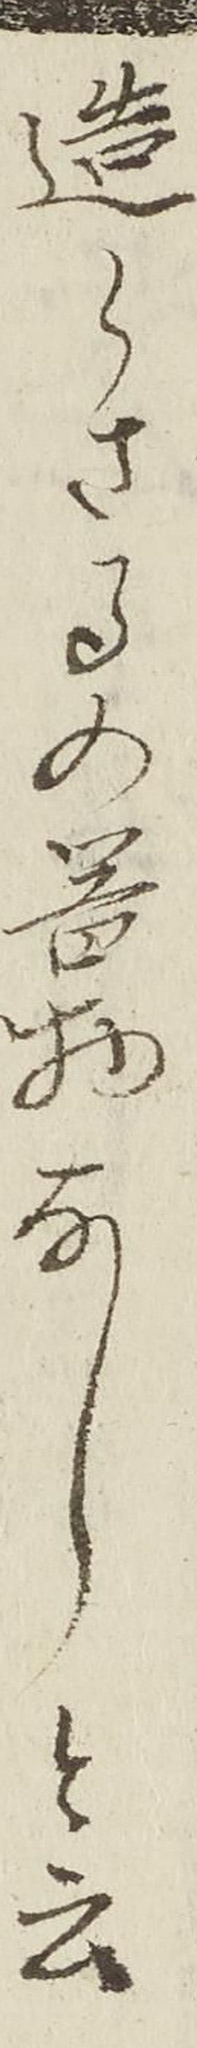造らさるの器物なしと云
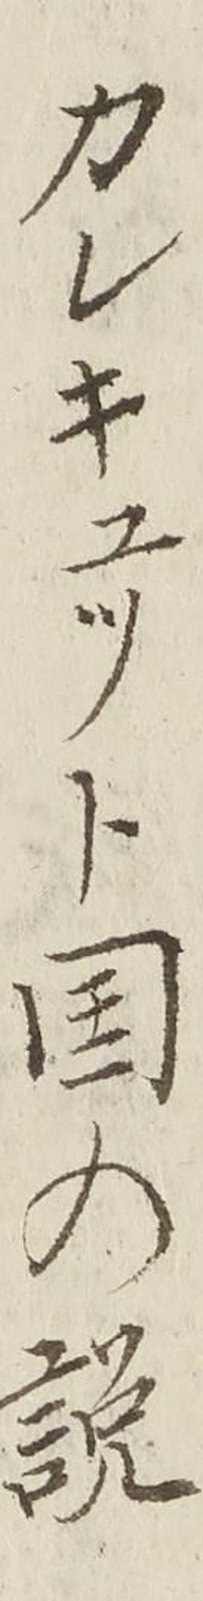カレキュット国の説
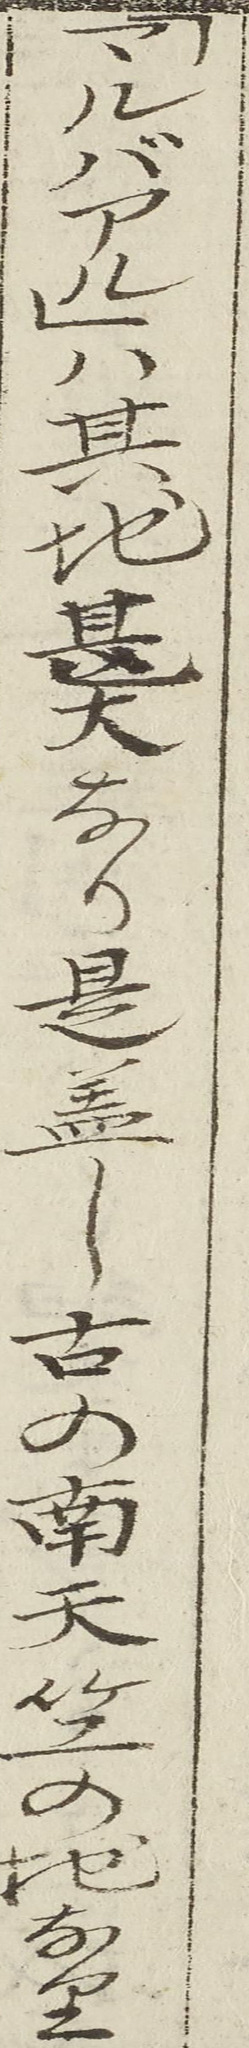「マルバアル」ハ其地甚大なり是蓋し古の南天竺の地なり
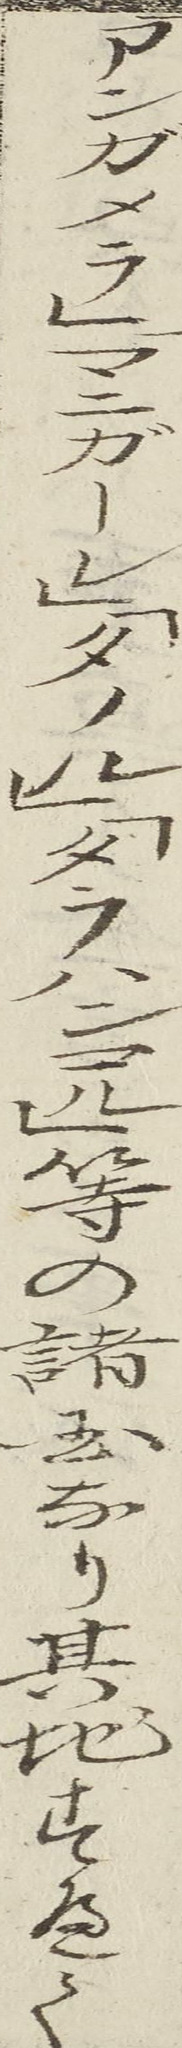「アンがメラ」「マニガール」「タノル」「タラハンコル」等の諸国なり其地すへて
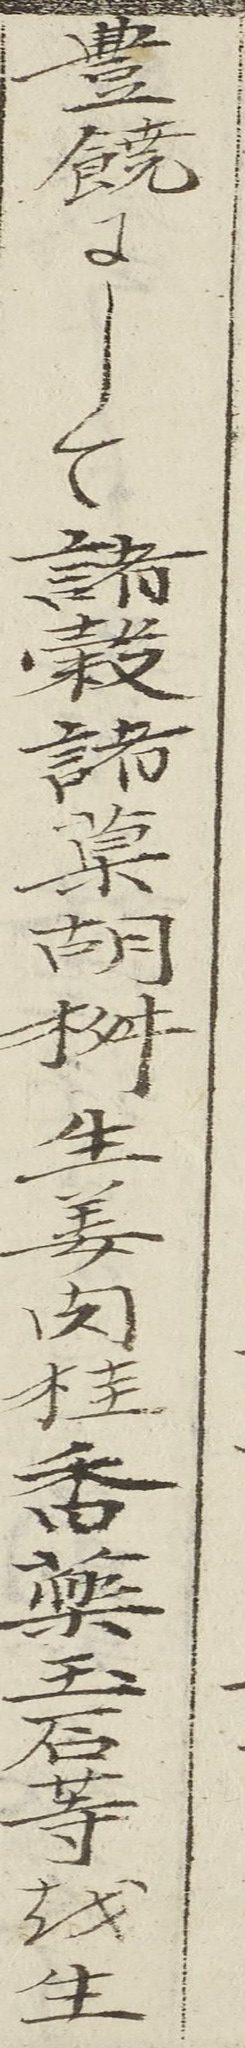豊饒にして諸穀諸菓胡桝生姜肉桂香薬玉石等を生
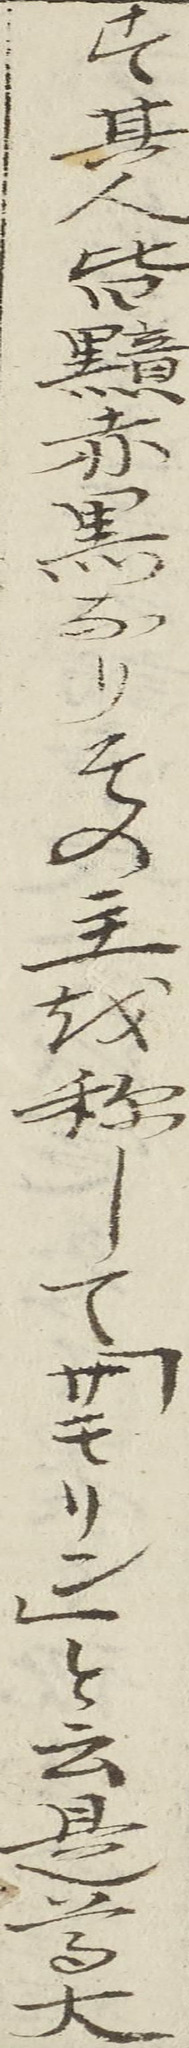す其人皆黯赤黒なりその主を称して「サモリン」と云是尊大
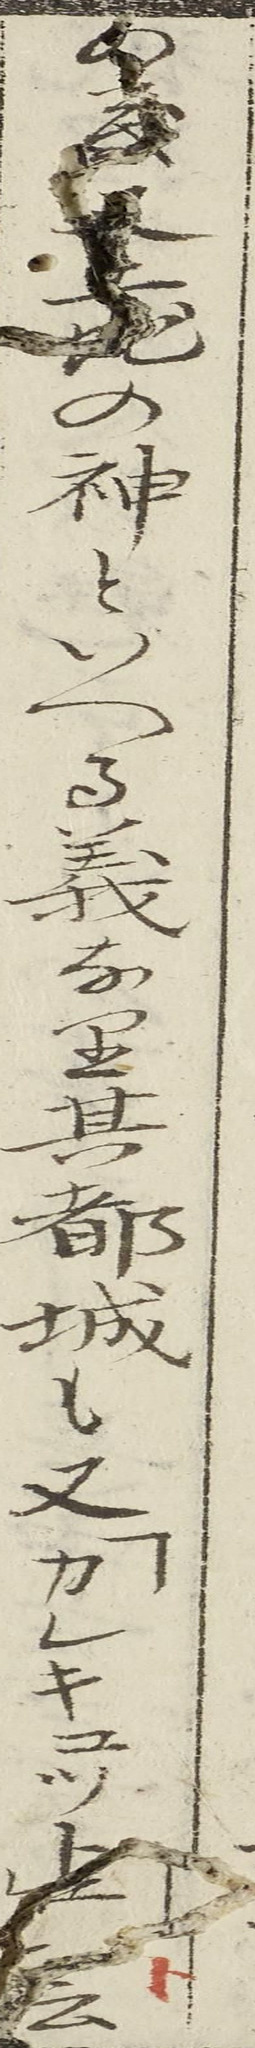なる土地の神といへる義なり其都城も又「カレキュット」と云
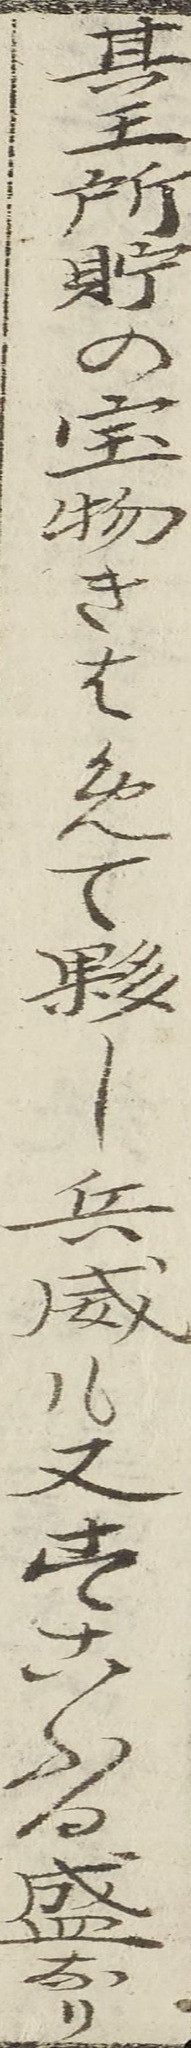其王所貯の宝物きはめて夥し兵威も又すこふる盛なり
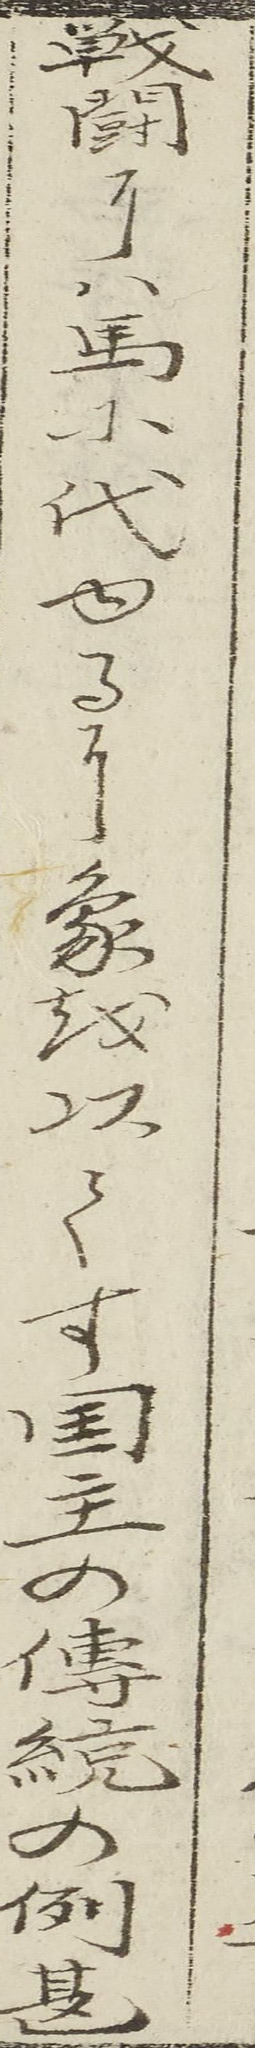戦闘にハ馬に代ゆるに象を以てす国主の伝統の例甚
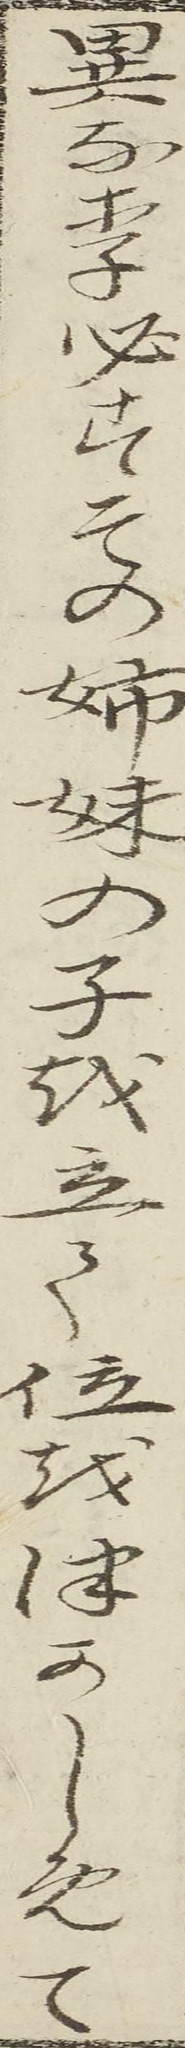異なり必すその姉妹の子を立て位をつかしめて

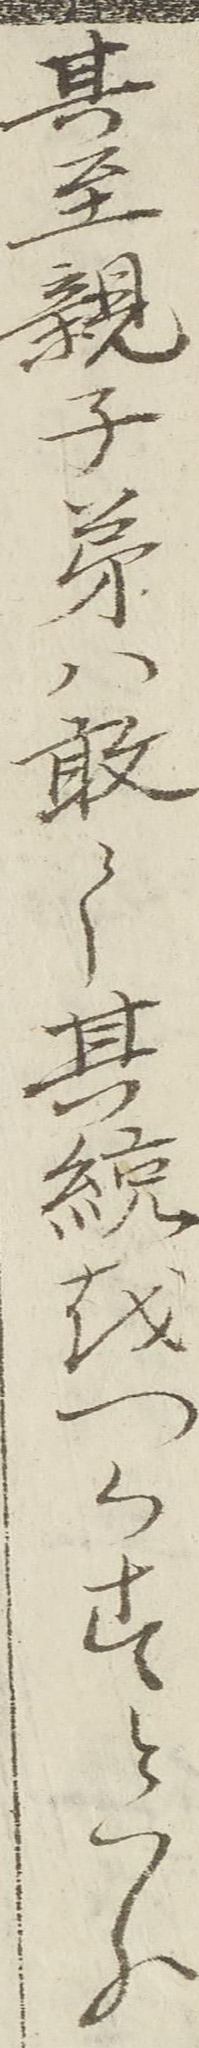其至親子弟ハ敢て其綂をつくすといふ
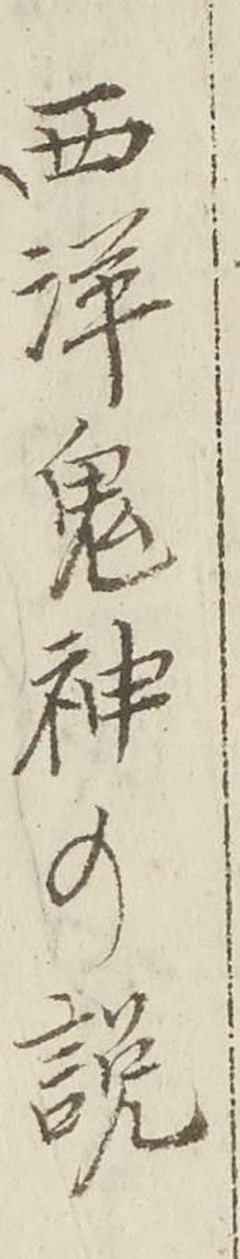西洋鬼神の説
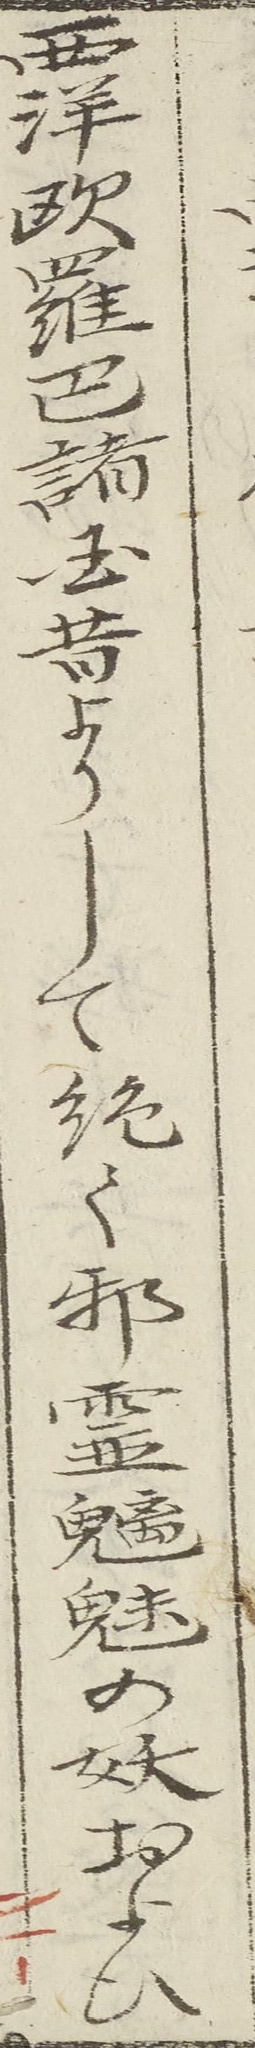西洋欧羅巴諸国昔よりして絶へて邦霊魑魅の妖およひ
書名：西洋雜記　坤
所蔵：東京大学地震研究所図書室 Earthquake Research Institute Library, The University of Tokyo, JAPAN
